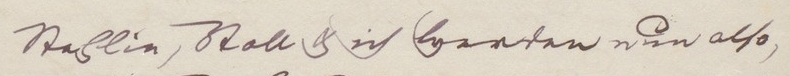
Stehlin, Stoll & ich werden nun also,
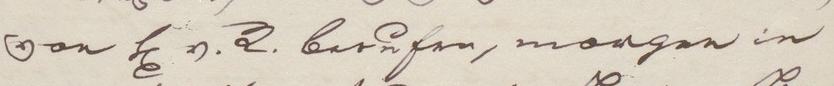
von Herrn. v. R. berufen, morgen in
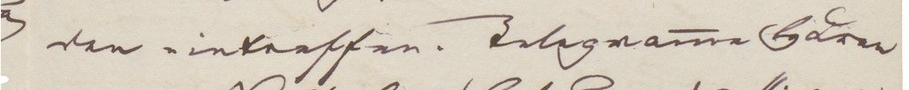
den eintreffen. Telegramme wären
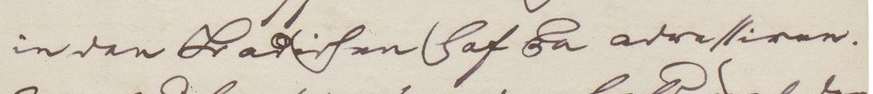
in den Badischen Hof zu adressiren.
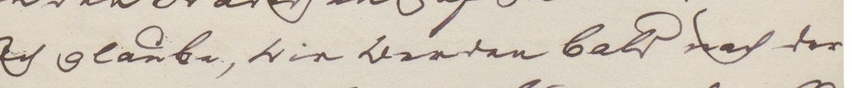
Ich glaube, wir werden bald nach der
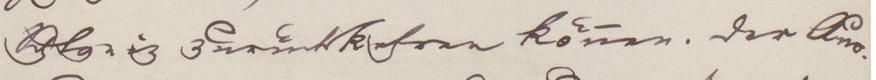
Schweiz zurückkehren können. Der Aus-
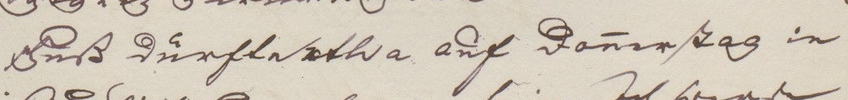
schuß dürfte etwa auf Donnerstag in
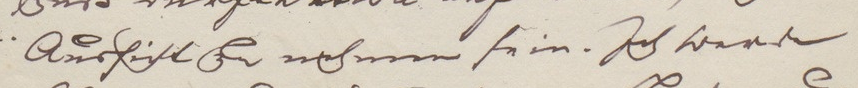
Aussicht zu nehmen sein. Ich werde
